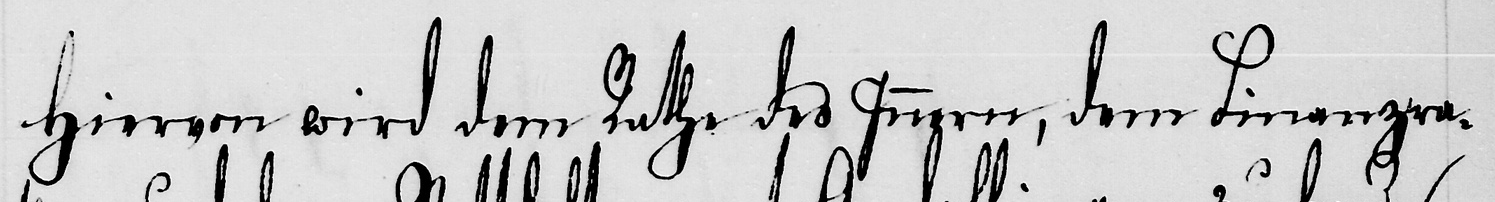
Hiervon wird dem Rathe des Innern, dem Finanzra¬
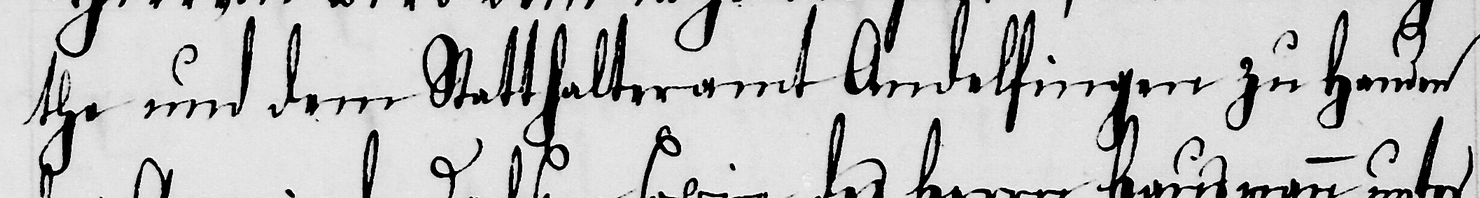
the und dem Statthalteramt Andelfingen zu Handen
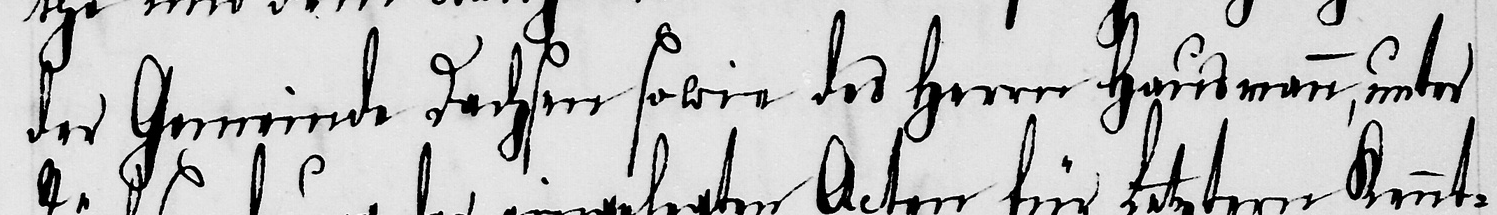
der Gemeinde Dachsen sowie des Herrn Hausmann, unter
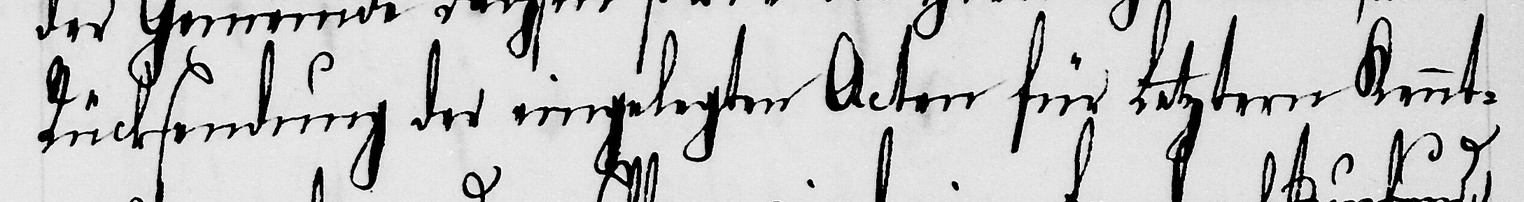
Rücksendung der eingelegten Acten für Letztern Kennt¬
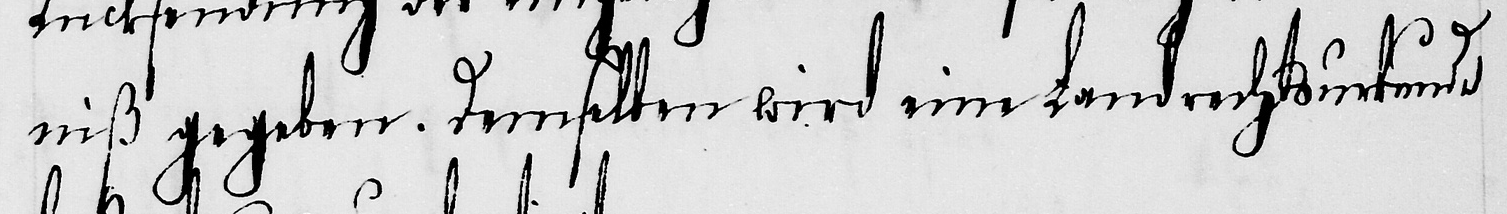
niß gegeben. Demselben wird eine Landrechtsurkunde
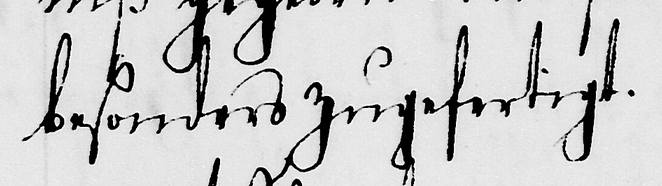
besonders zugefertigt.
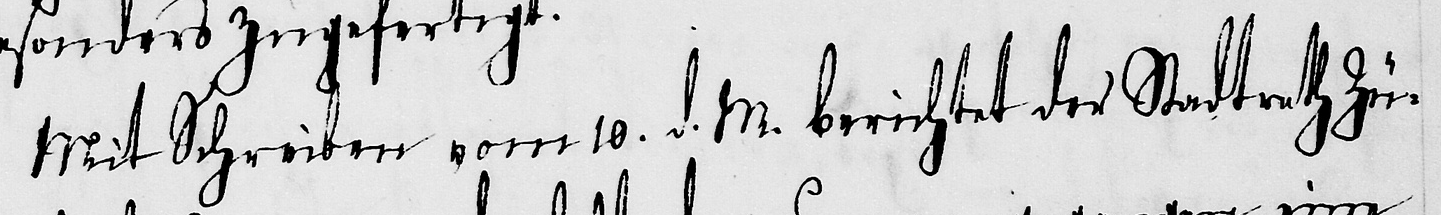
Mit Schreiben vom 10. d. M. berichtet der Stadtrath Zü¬
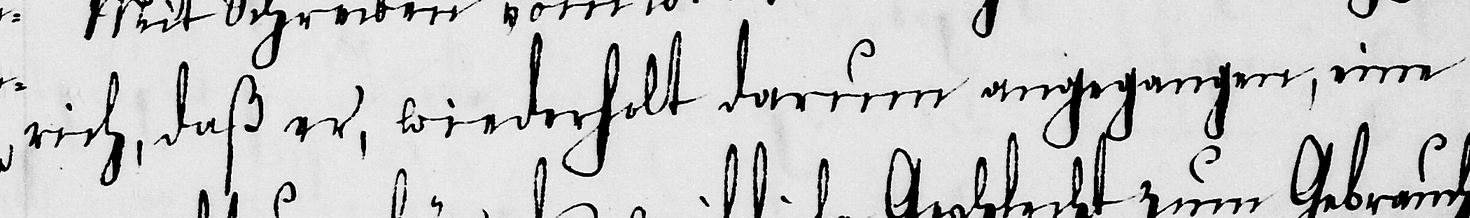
rich, daß er, wiederholt darum angegangen, eine
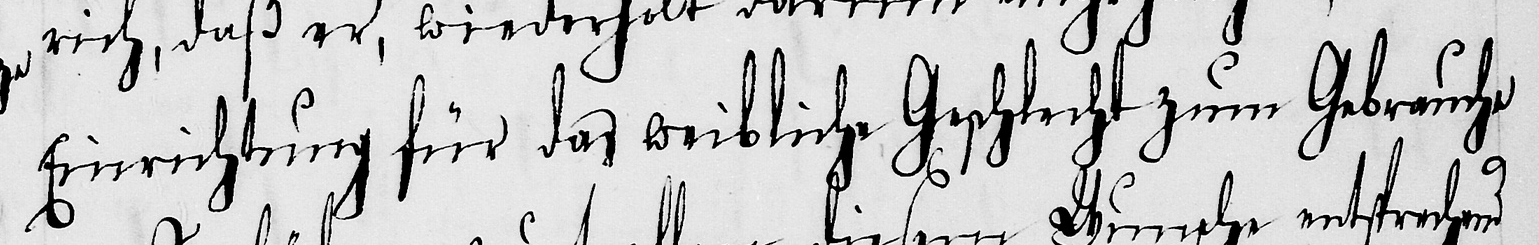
Einrichtung für das weibliche Geschlecht zum Gebrauche
